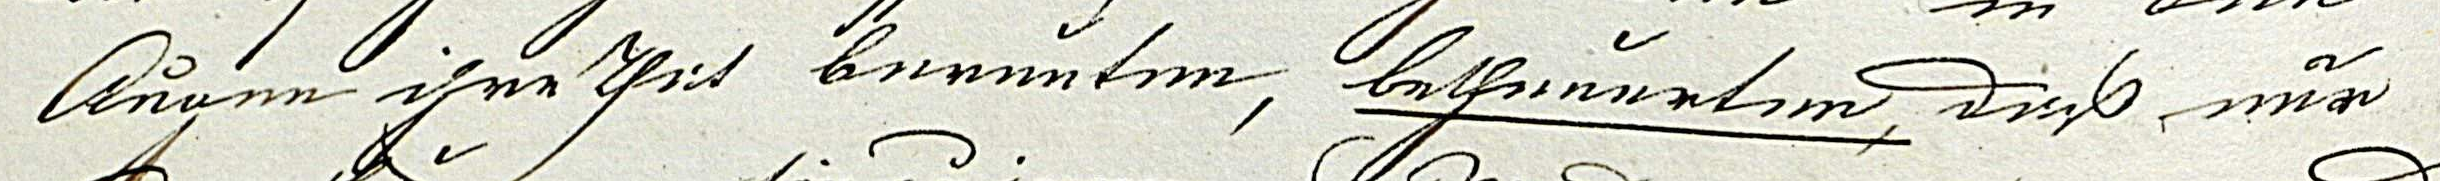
Augen ihre That bereuten, betheuerten, daß nur
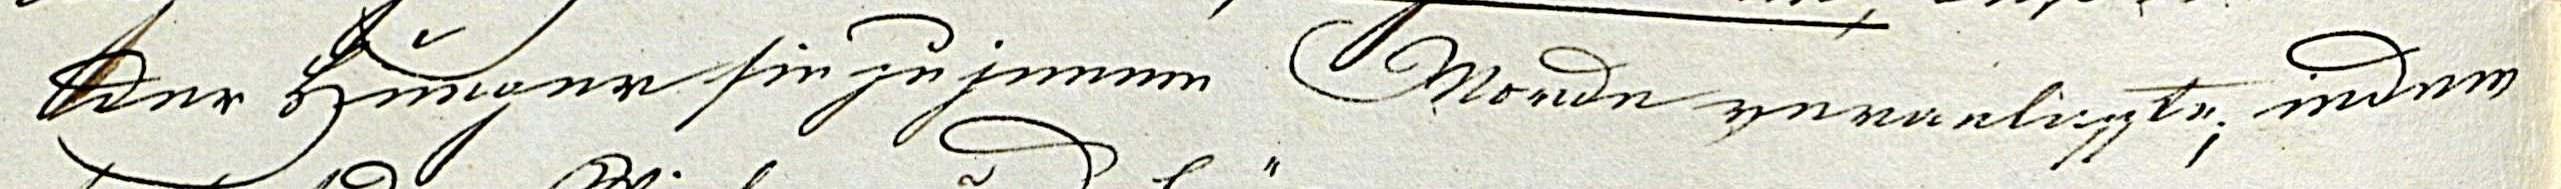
der Hunger sie zu jenem Morde veranlasste, indem
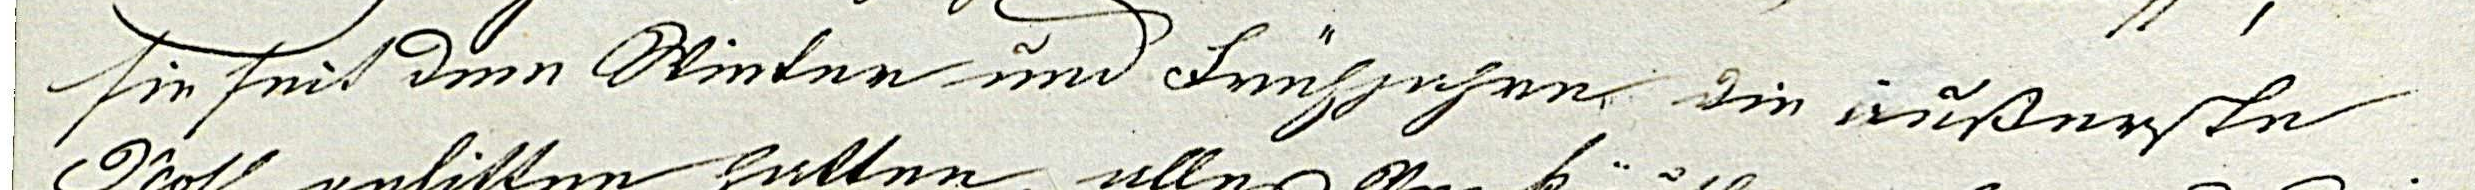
sie seit dem Winter und Frühjahre die äußerste
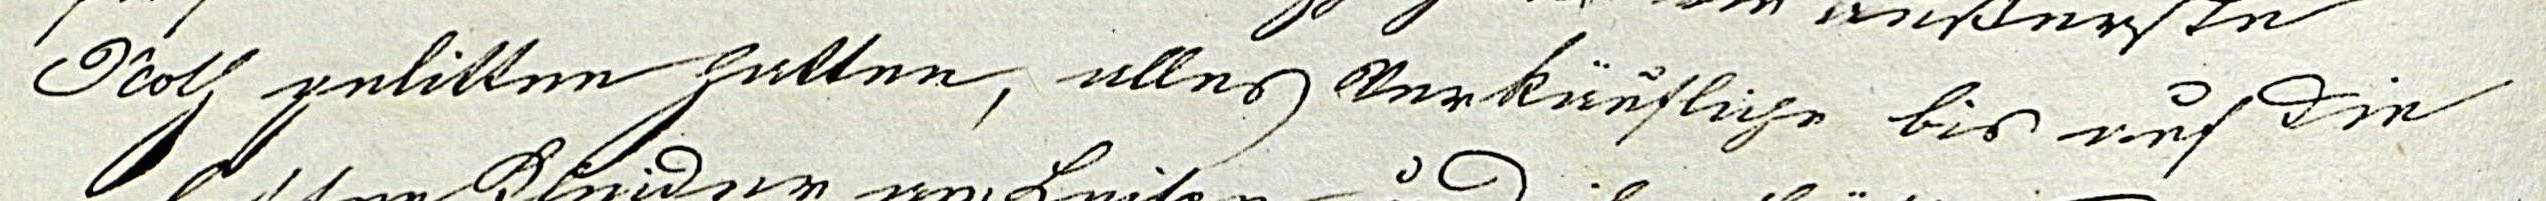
Noth gelitten hatten, alles verkäufliche bis auf die
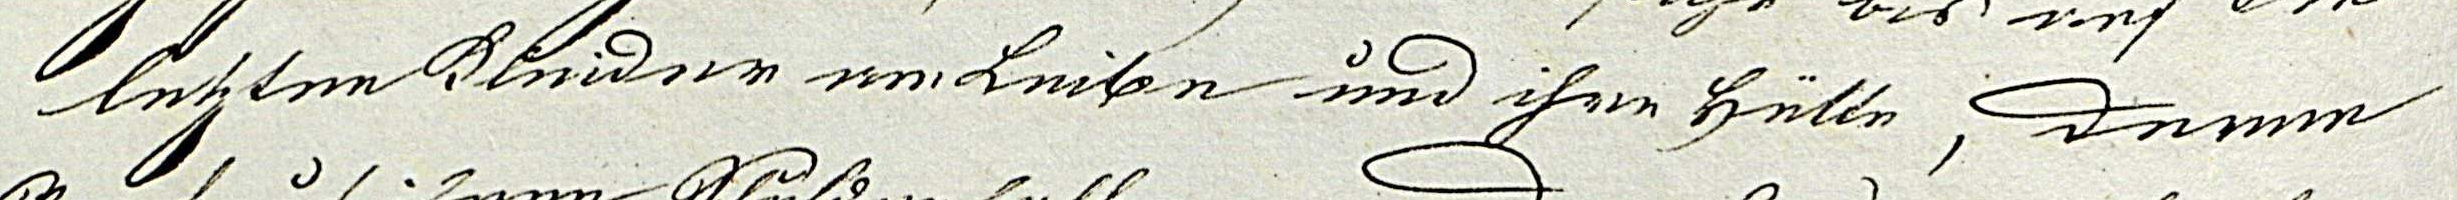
letzten Kleider am Leibe und ihre Hütte, deren
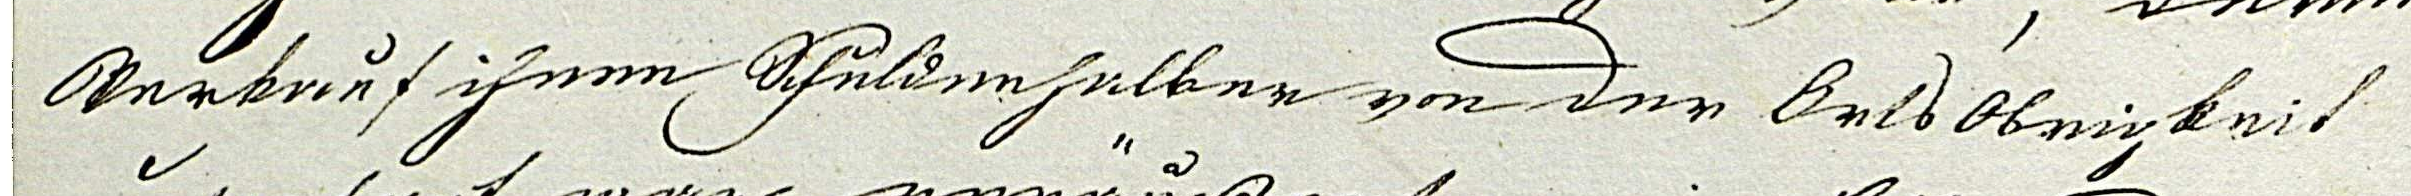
Verkauf ihnen Schuldenhalber von der Ortsobrigkeit
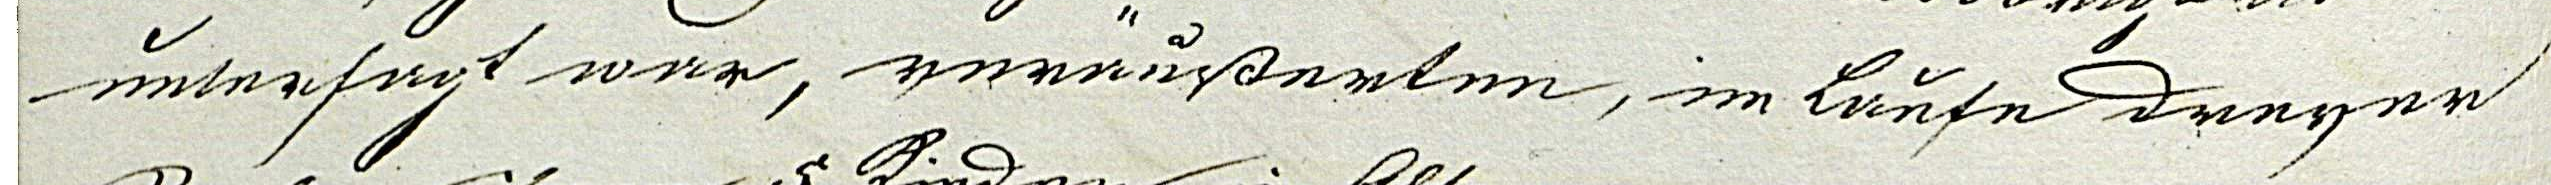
untersagt war, veräußerten, im Laufe dreyer
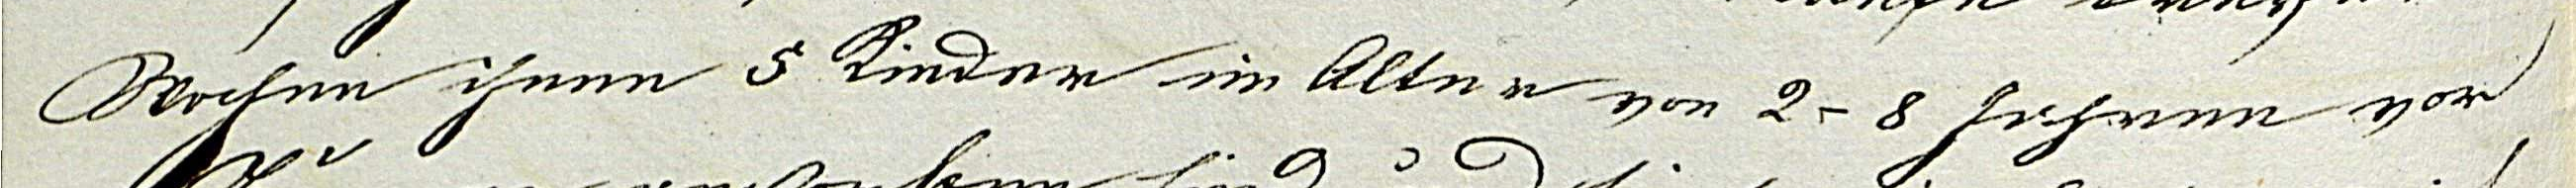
Wochen ihren 5 Kinder im Alter von 2-8 Jahren vor
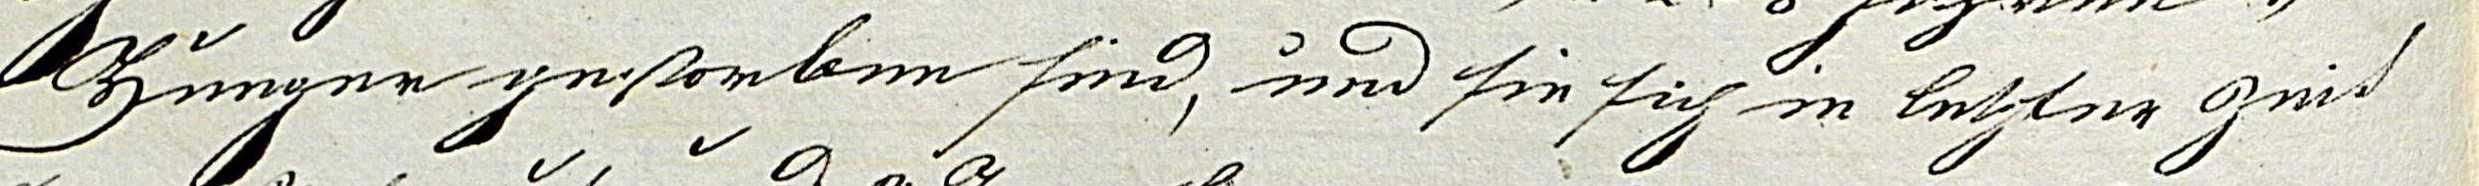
Hunger gestorben sind, und sie sich in letzter Zeit
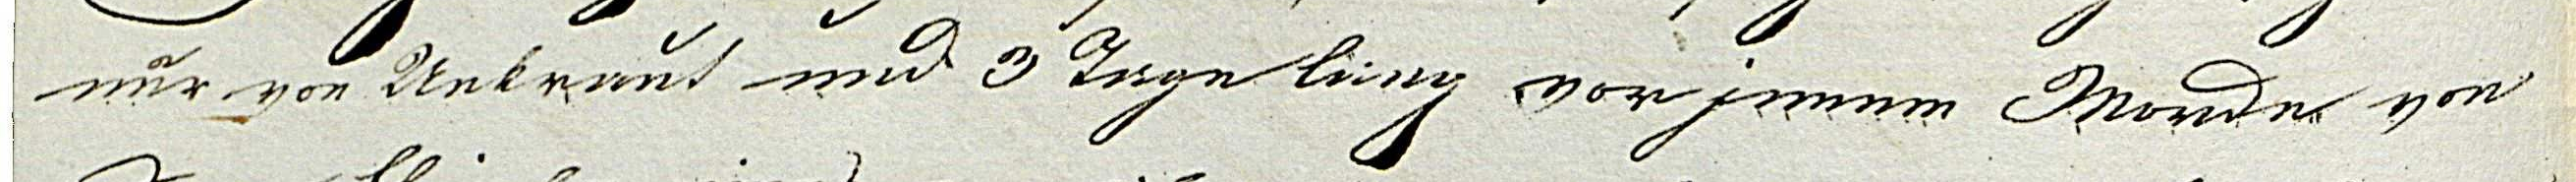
nur von Unkraut und 3 Tage lang vor jenem Morde von
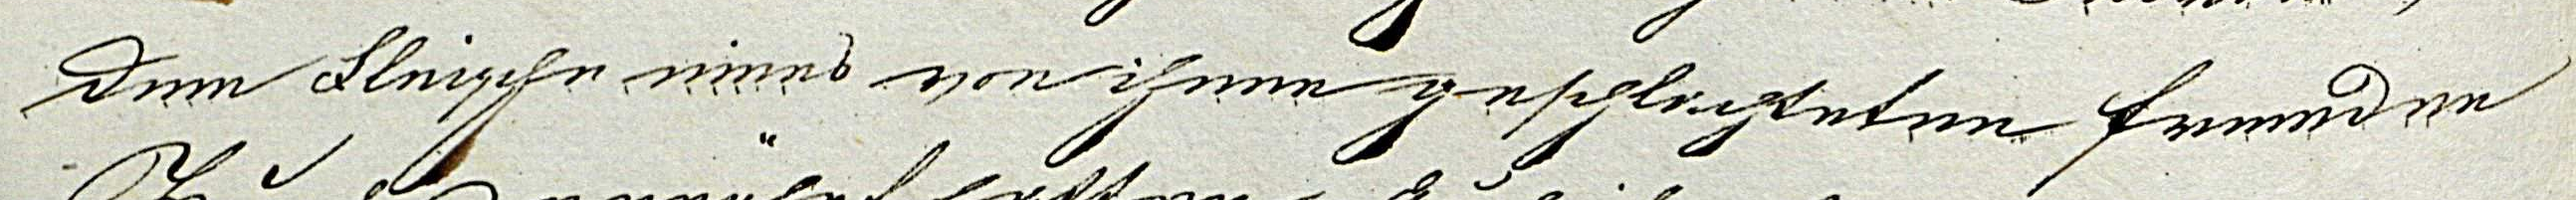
dem Fleische eines von ihnen geschlachteten fremden
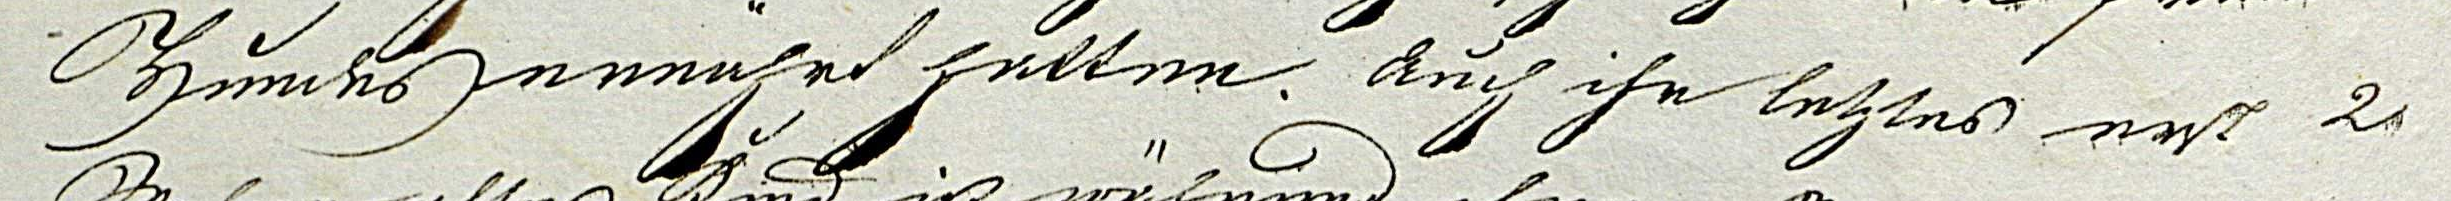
Hundes ernährt hatten. Auch ihr letztes erst 2
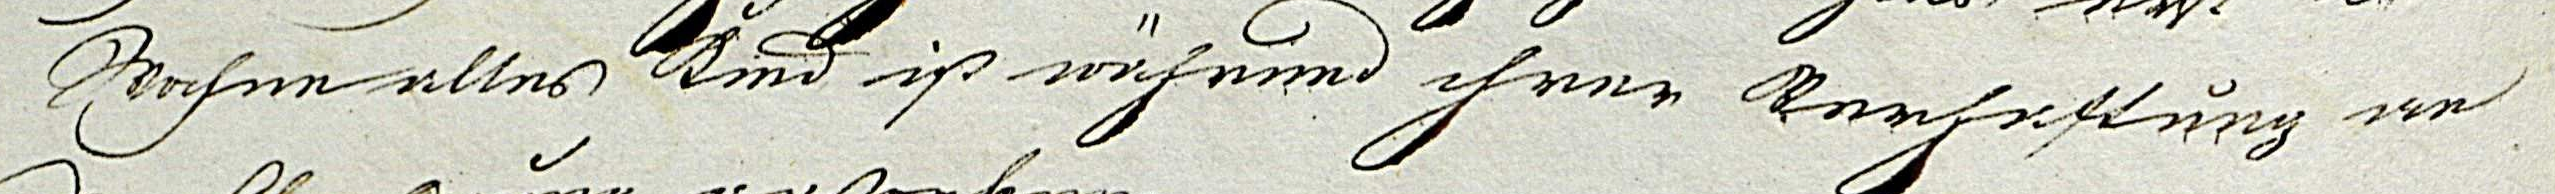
Wochen altes Kind ist während ihrer Verhaftung an
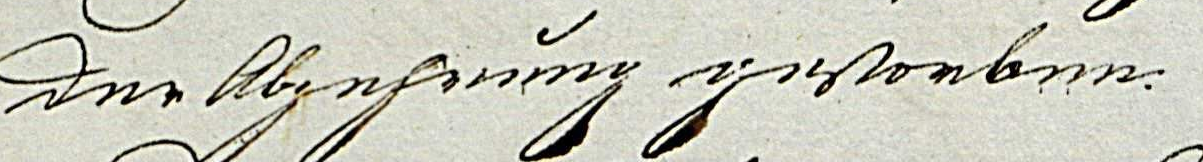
den Abzehrung [emaciation] gestorben.
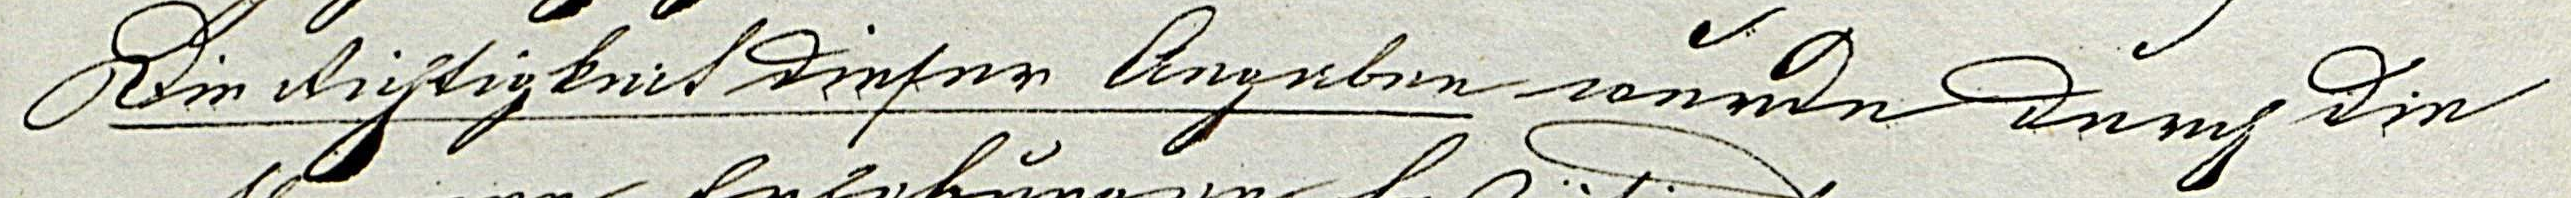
Die Richtigkeit dieser Angaben wurde durch die
